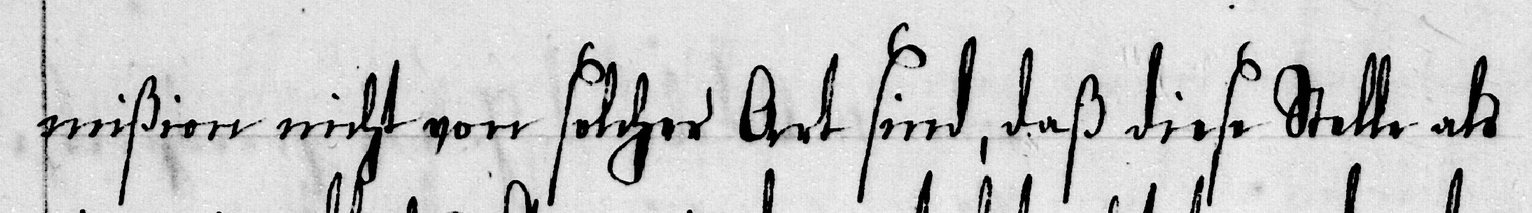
mißion nicht von solcher Art sind, daß diese Stelle als
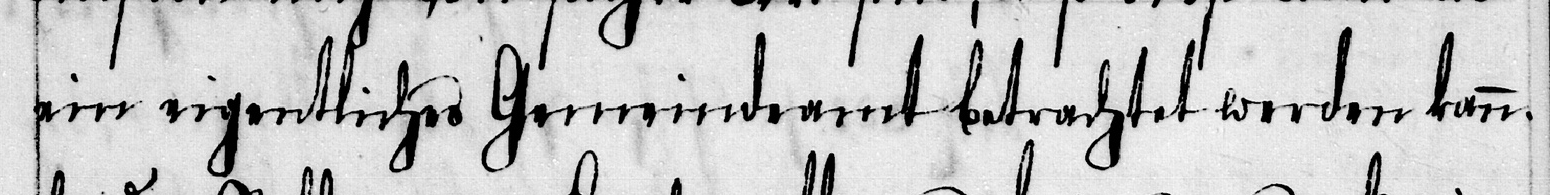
ein eigentliches Gemeindeamt betrachtet werden kann.
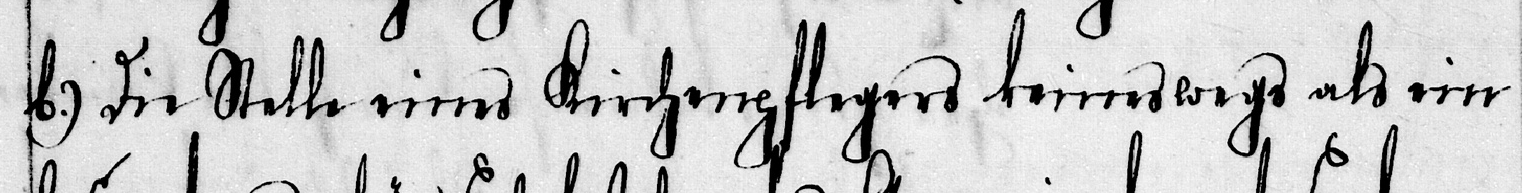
b.) Die Stelle eines Kirchenpflegers keineswegs als ein
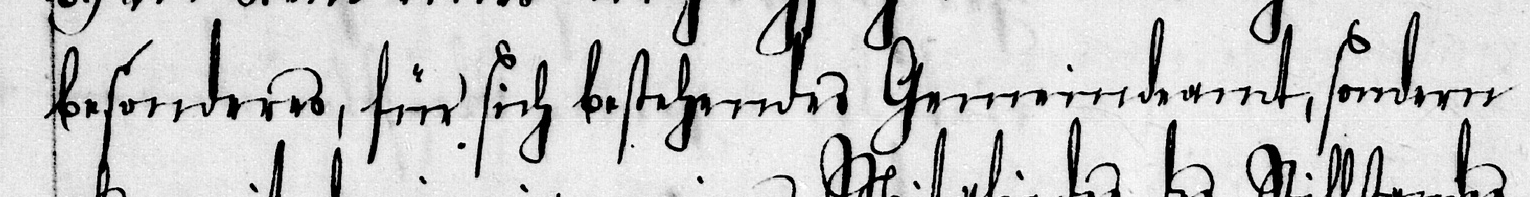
besonderes, für sich bestehendes Gemeindeamt, sondern
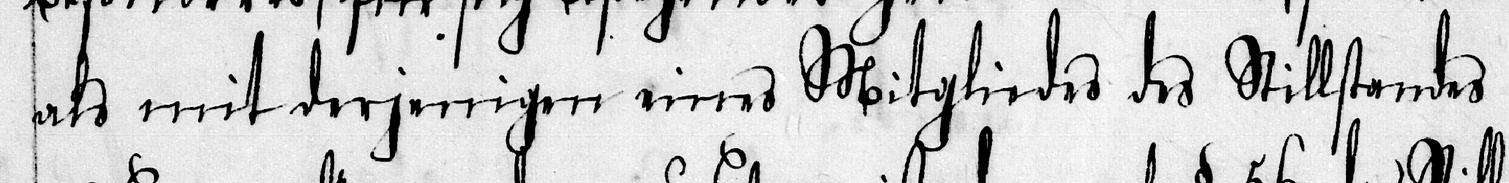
als mit derjenigen eines Mitgliedes des Stillstandes
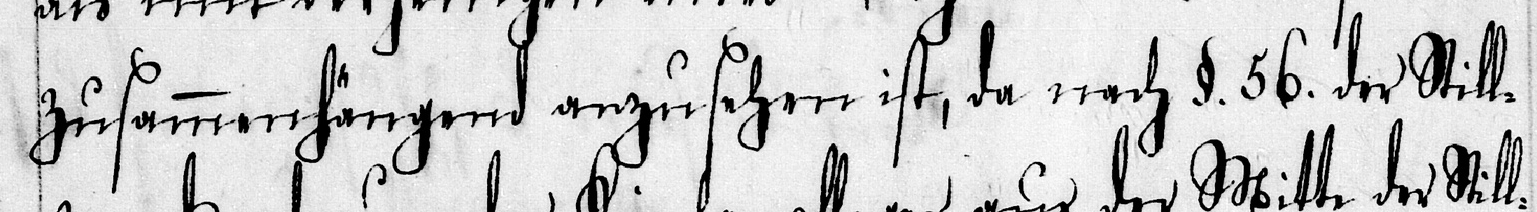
zusammenhängend anzusehen ist, da nach §. 56. der Still¬
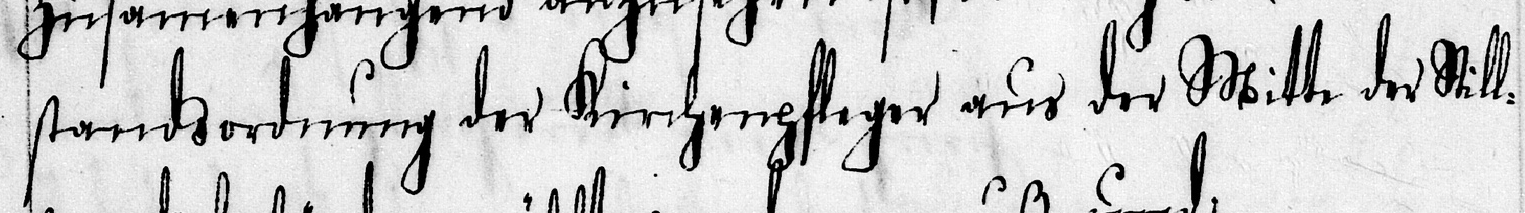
standsordnung der Kirchenpfleger aus der Mitte der Stil¬
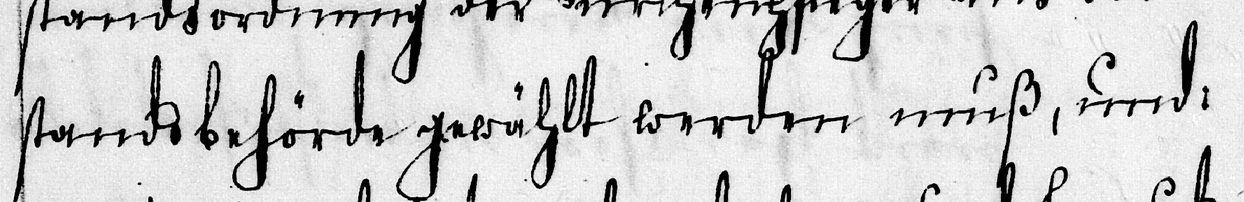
standsbehörde gewählt werden muß, und,
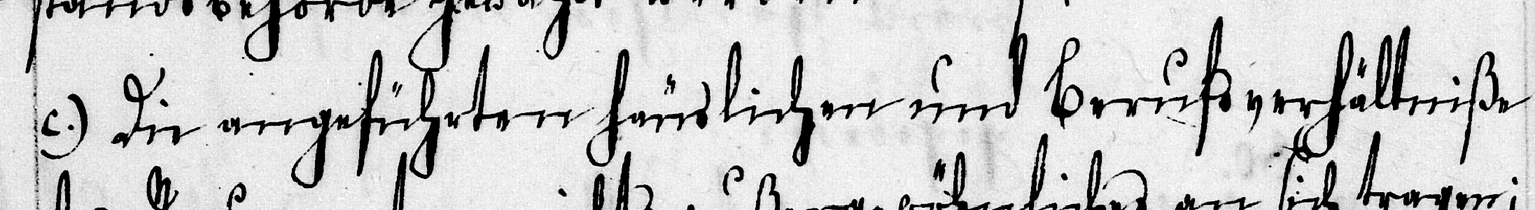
c.) Die angeführten häuslichen und Berufsverhältniße
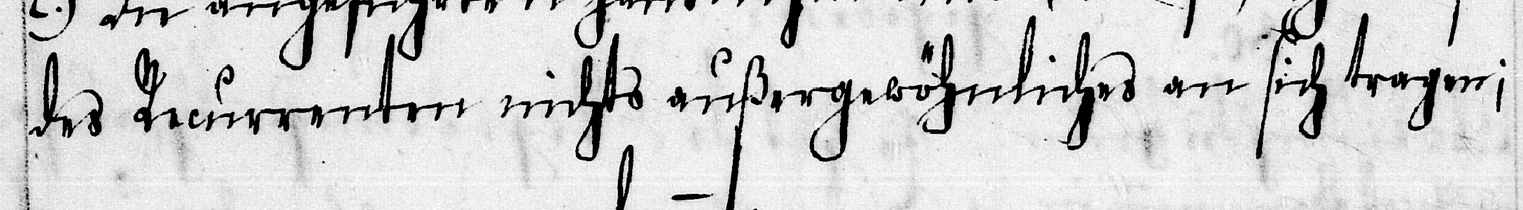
des Recurrenten nichts außergewöhnliches an sich tragen;
